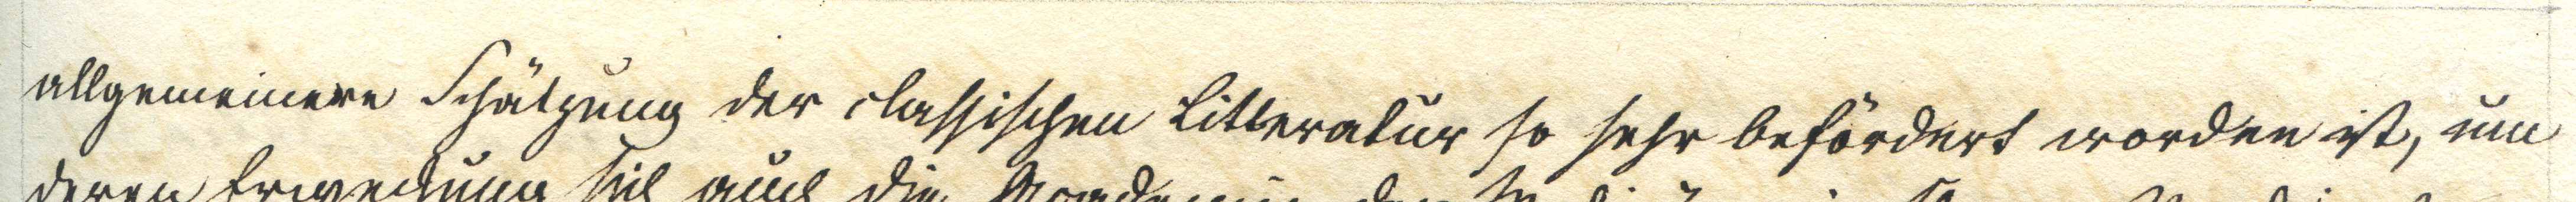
allgemeinere Schätzung der classischen Litteratur so sehr befördert worden ist, um
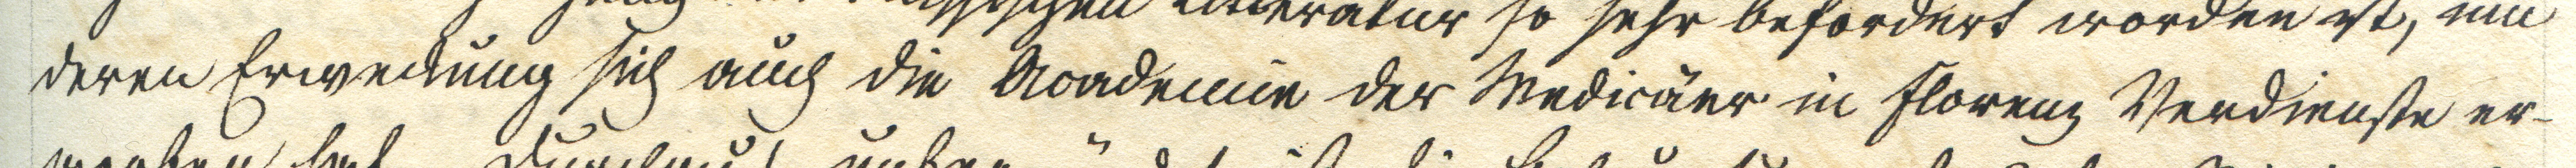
deren Erweckung sich auch die Academie der Medicäer in Florenz Verdienste er-
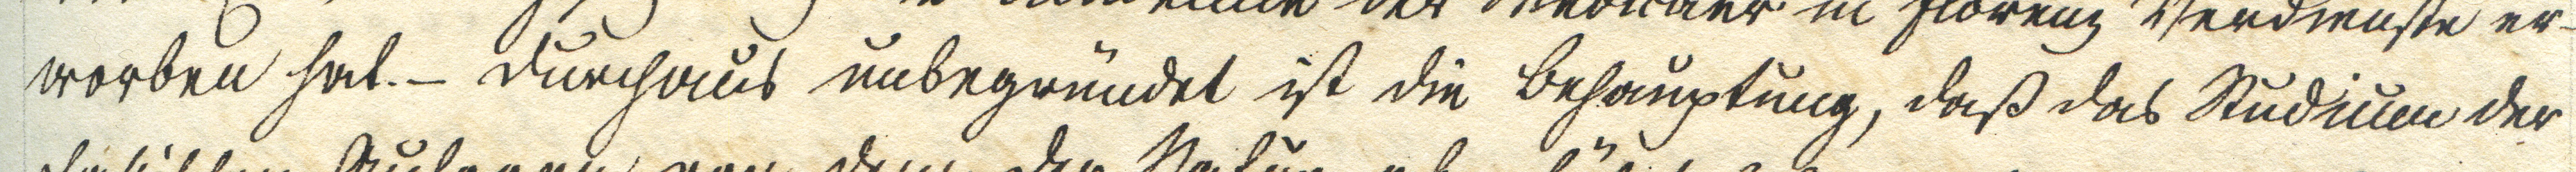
worben hat. – Durchaus ungegründet ist die Behauptung, daß das Studium der
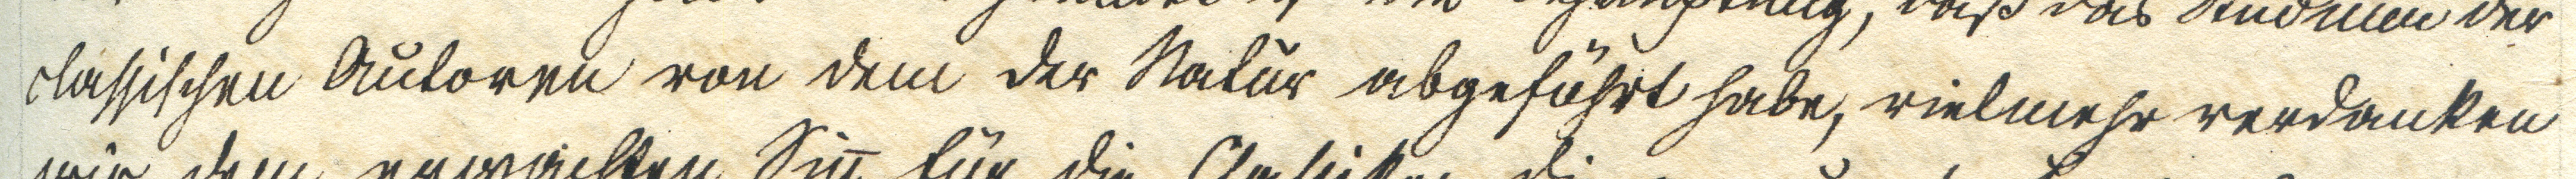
classischen Autoren von dem der Natur abgeführt habe, vielmehr verdanken
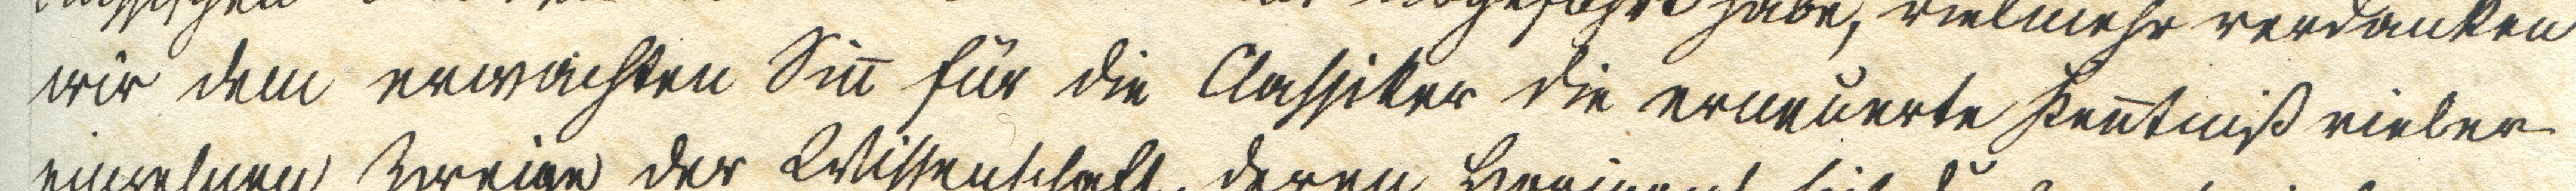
wir dem erwachten Siñ für die Classiker die erneuerte Keñtniß vieler
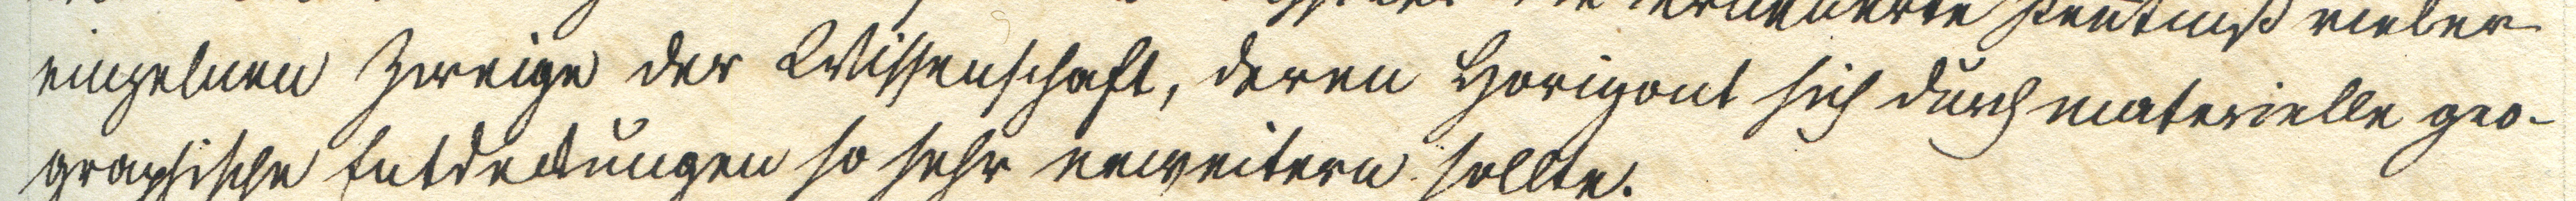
einzelner Zweige der Wissenschaft, deren Horizont sich durch materielle geo-
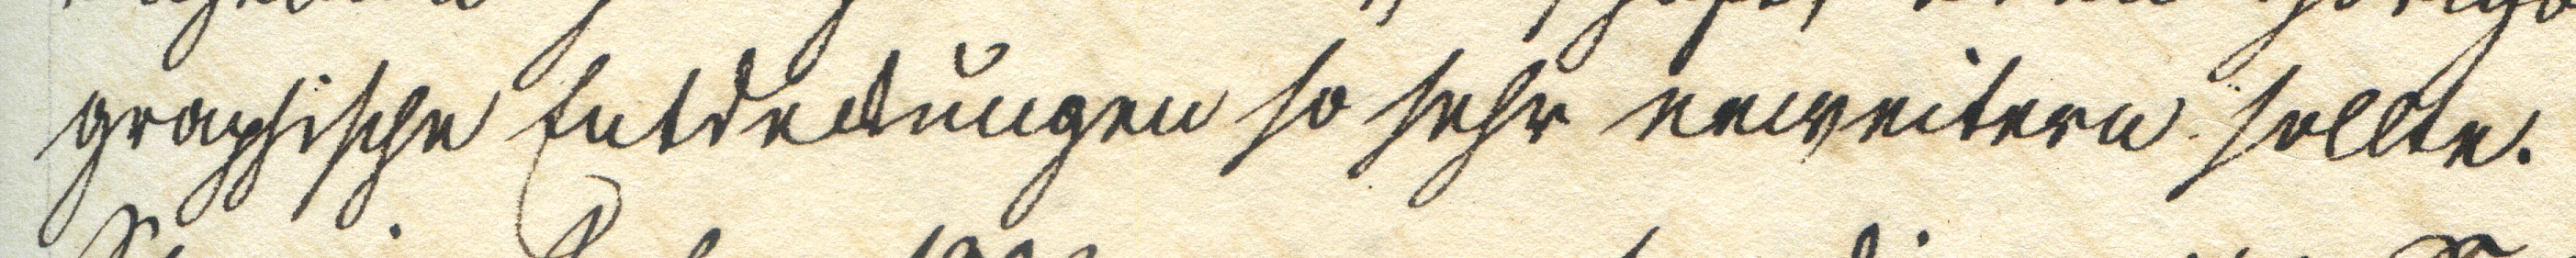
graphische Entdeckungen so sehr erweitern sollte.
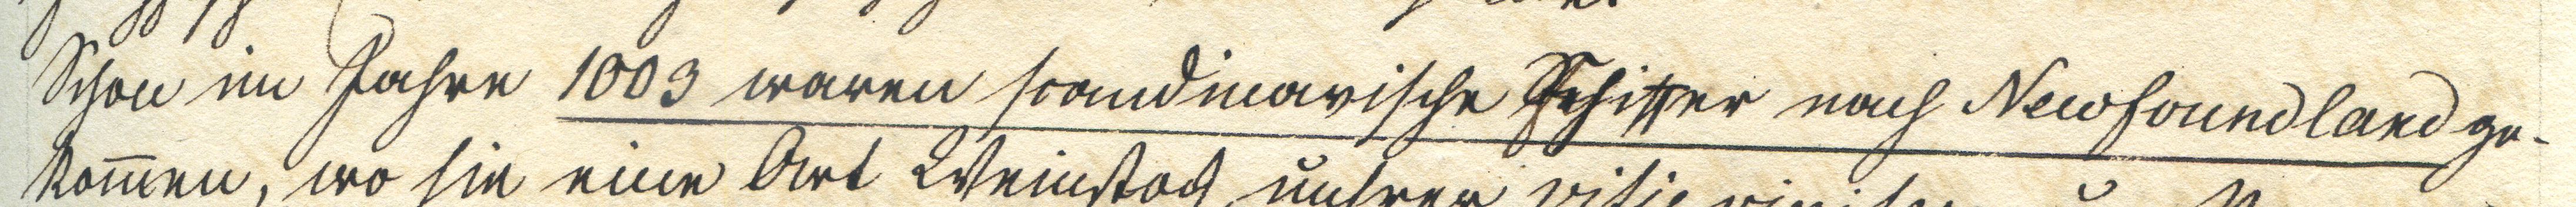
Schon im Jahre 1003 waren scandinavische FisSchiffer nach Newfoundland ge-
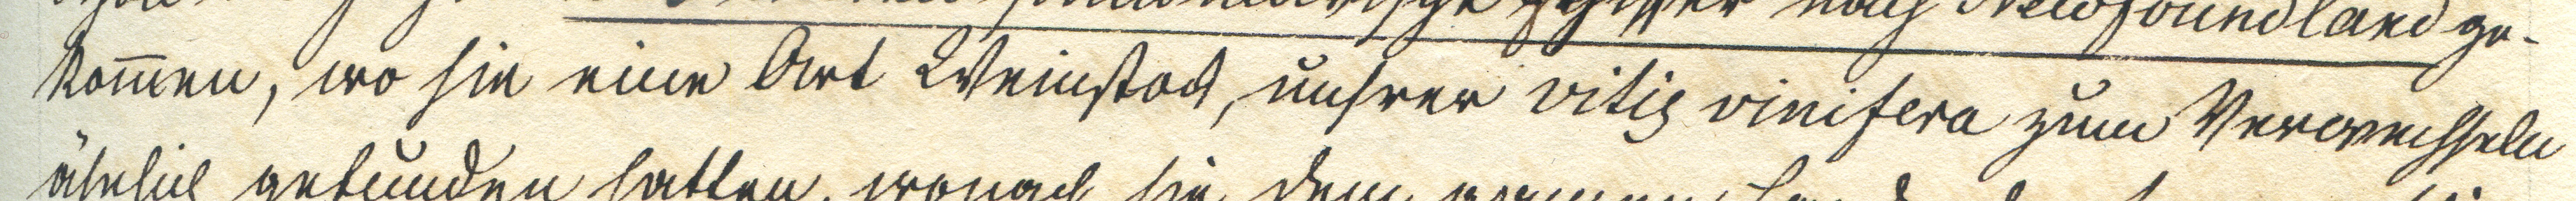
kom̃en, wo sie eine Art Weinstock, unsrer vitis vinifera zum Verwechseln
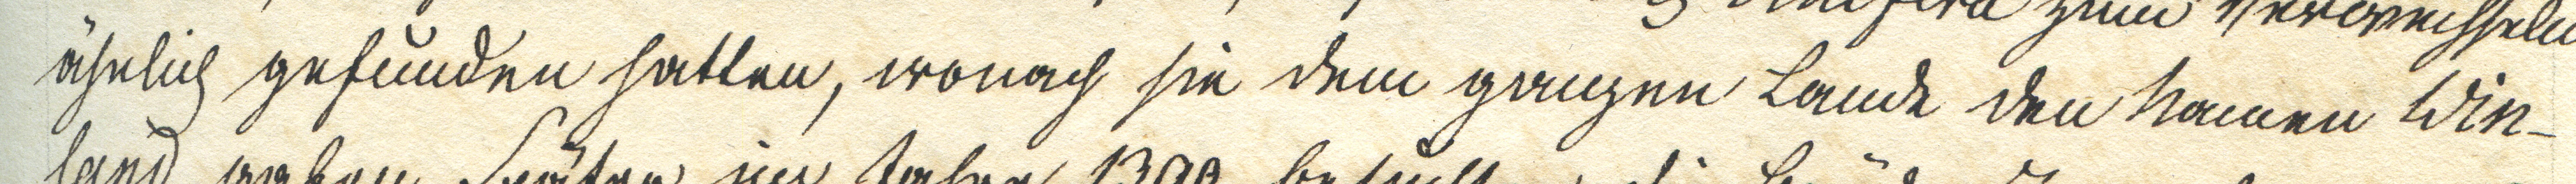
ähnlich gefunden hatten, wonach sie dem ganzen Lande den Namen Win-
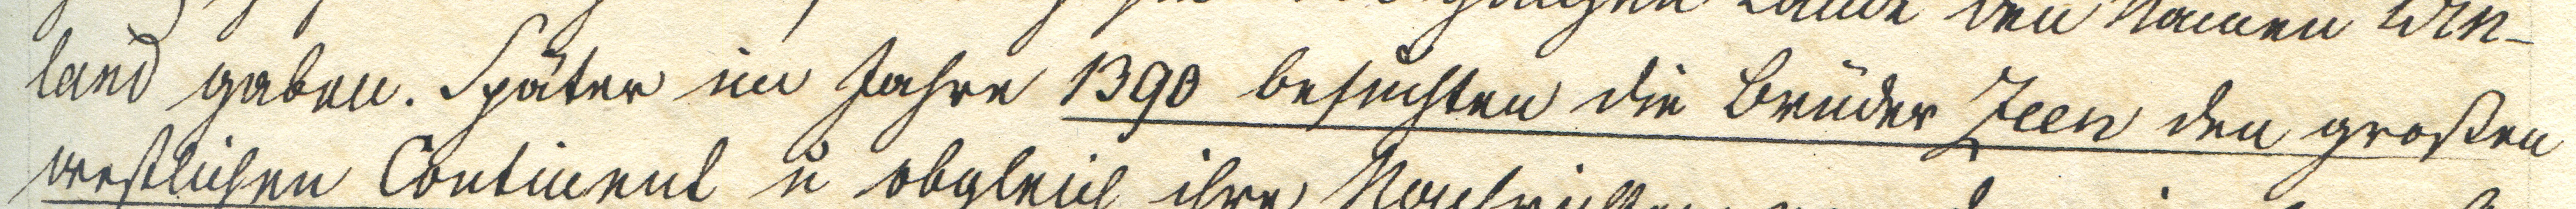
land gaben. Später im Jahre 1390 besuchten die Brüder Zeen den großen
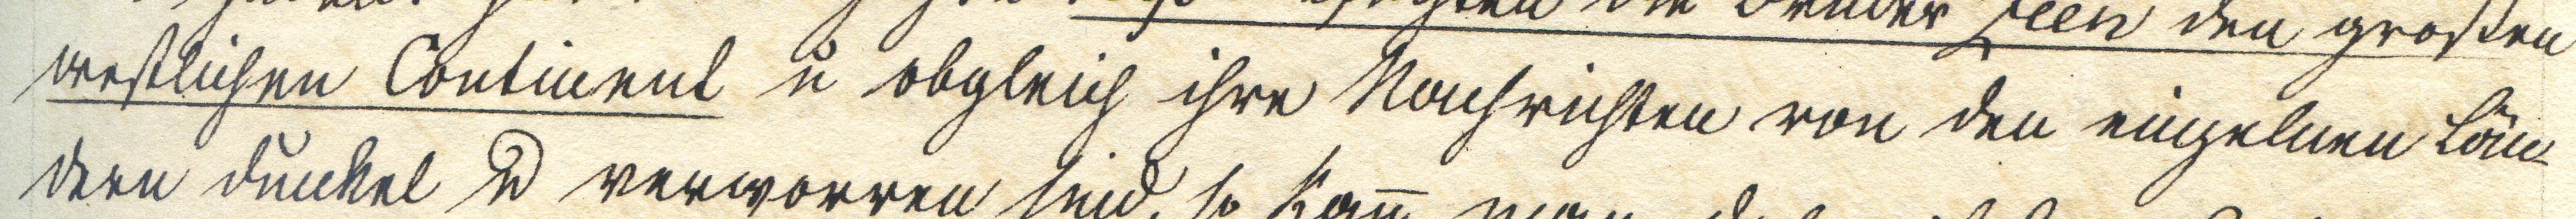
westlichen Continent u obgleich ihre Nachrichten von den einzelnen Län-
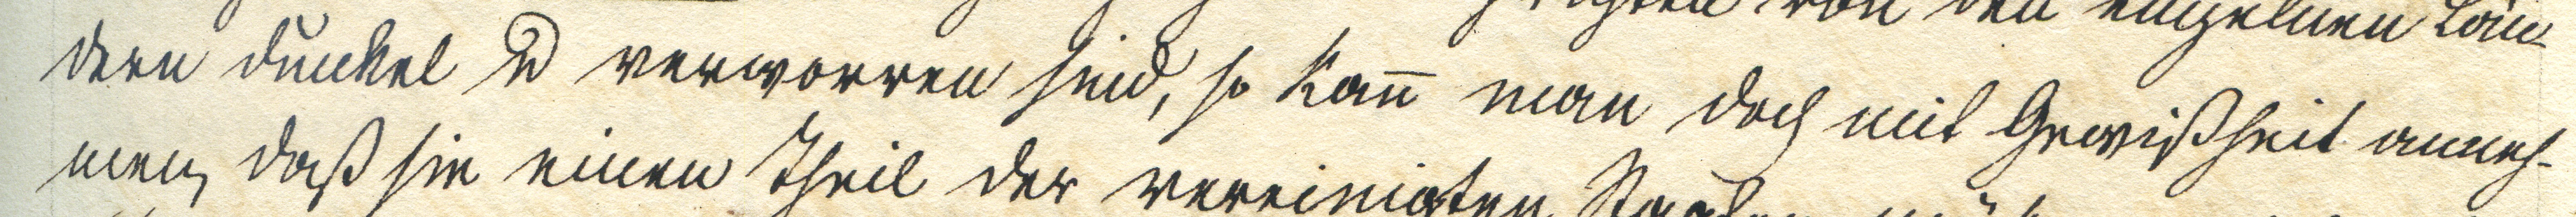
dern dunkel u verworren sind, so kañ man doch mit Gewißheit anneh-
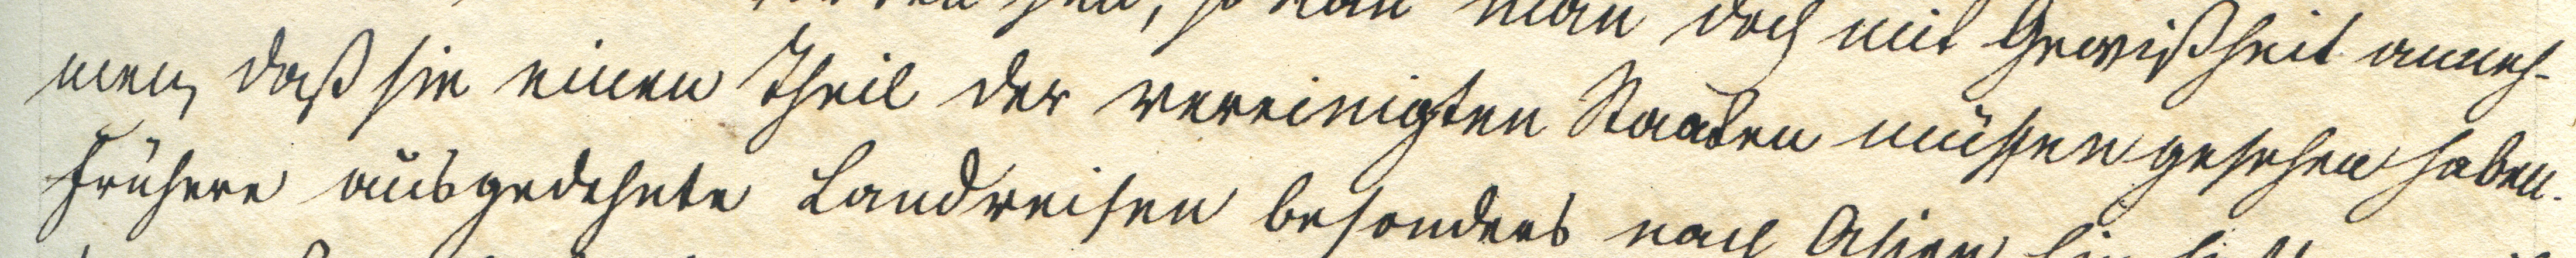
men, daß sie einen Theil der vereinigten Staaten müssen gesehen haben.
